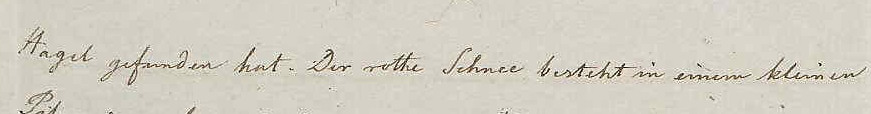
Hagel gefunden hat. Der rothe Schnee besteht in einem kleinen
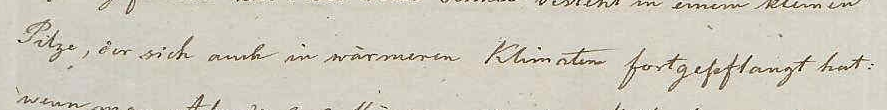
Pilze, der sich auch in wärmeren Klimaten fortgepflanzt hat:
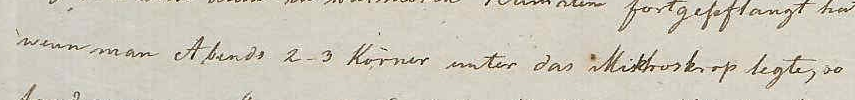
wenn man Abends 2–3 Körner unter das Mikroskop legte, so
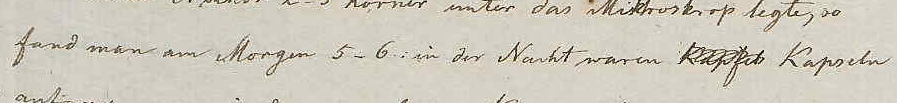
fand man am Morgen 5–6: in der Nacht waren KapfelKapseln
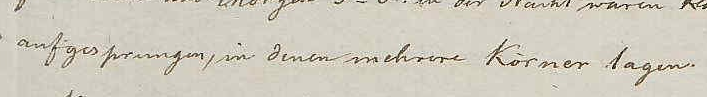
aufgesprungen, in denen mehrere Körner lagen.
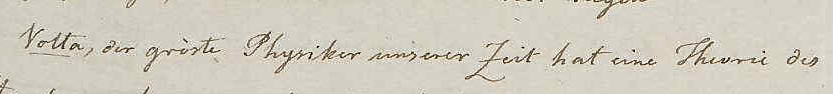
Volta, der gröste Physiker unserer Zeit hat eine Theorie des
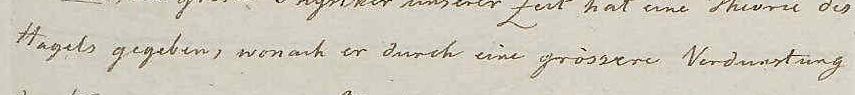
Hagels gegeben, wonach er durch eine grössere Verdunstung
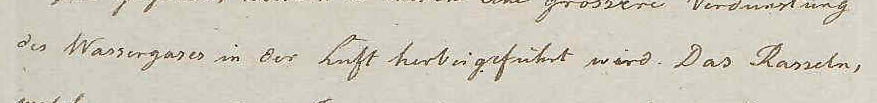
des Wassergases in der Luft herbeigeführt weird. Das Rasseln,
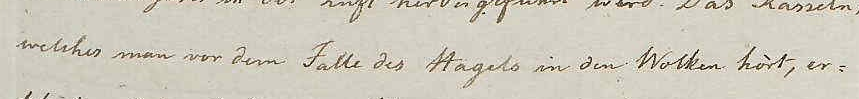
welches man vor dem Falle des Hagels in den Wolken hört, er-
